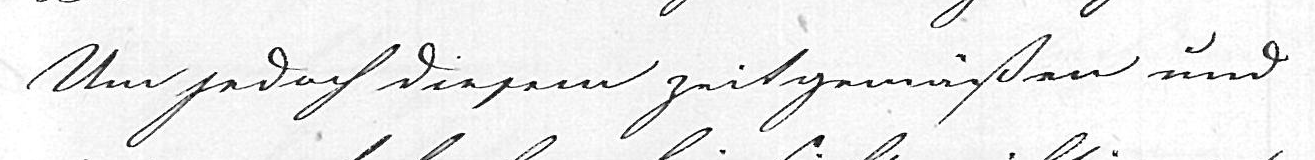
Um jedoch diesem zeitgemäßen und
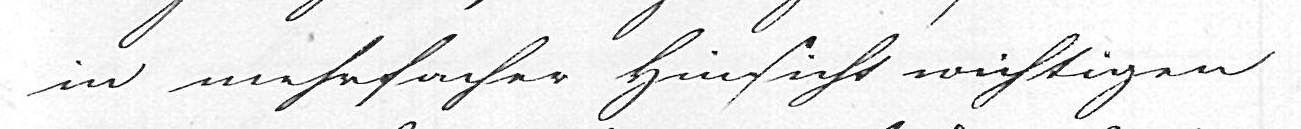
in mehrfacher Hinsicht wichtigen
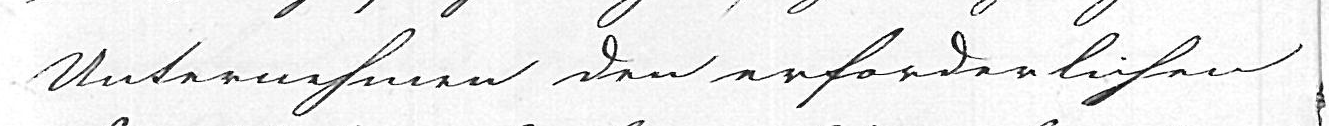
Unternehmen den erforderlichen
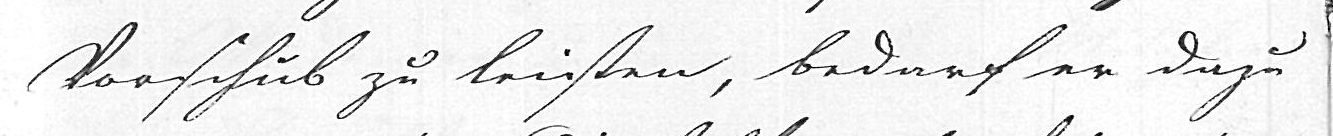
Vorschub zu leisten, bedarf er dazu
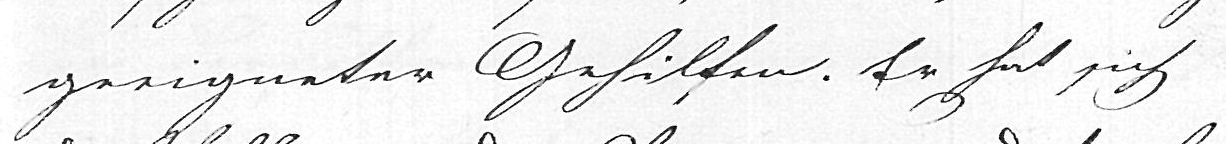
geeigneter Gehilfen. Er hat sich
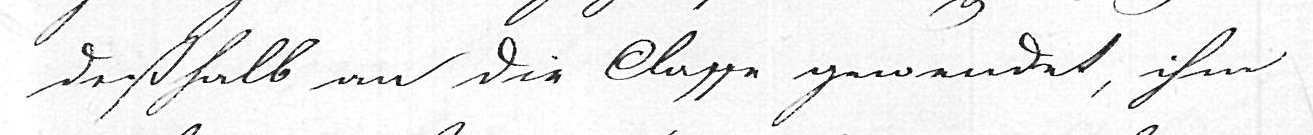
deßhalb an die Classe gewendet, ihm
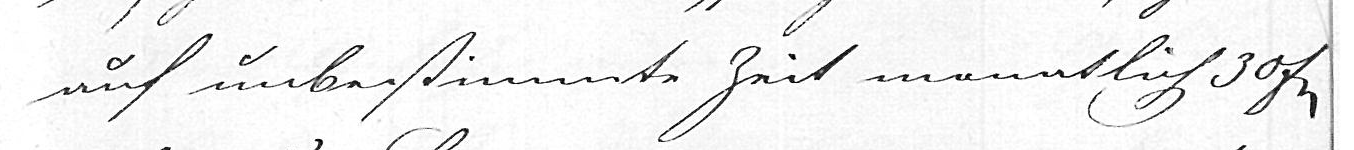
auf unbestimmte Zeit monatlich 30 fl
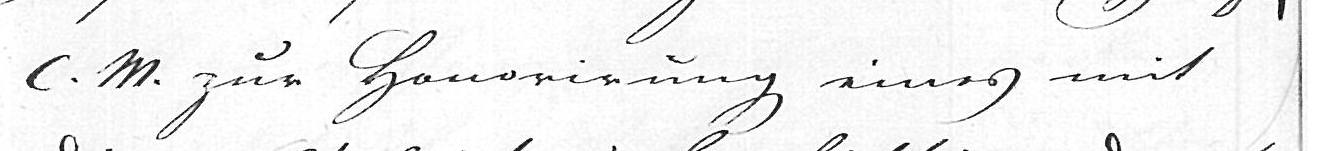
C. W. zur Honorirung eines mit
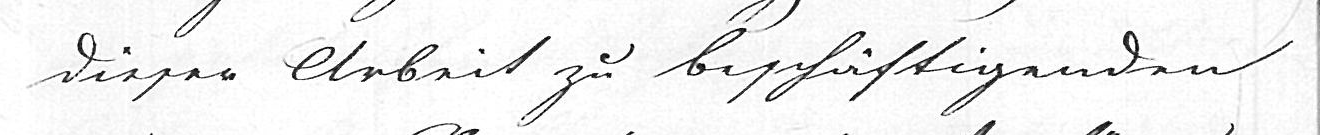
dieser Arbeit zu beschäftigenden
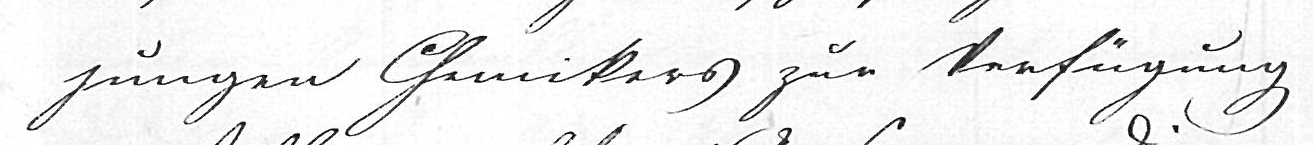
jungen Chemikers zur Verfügung
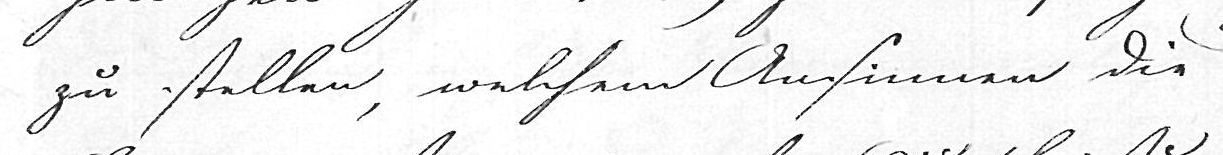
zu stellen, welchem Ansinen die
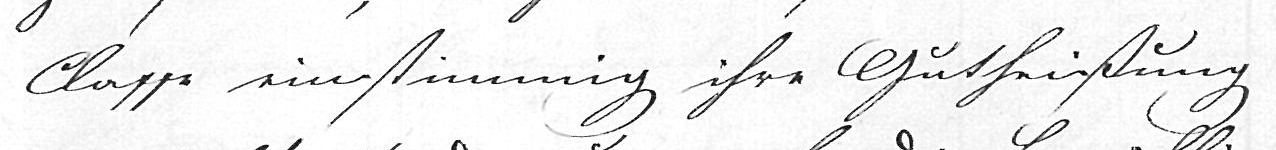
Classe einstimmig ihre Gutheißung
